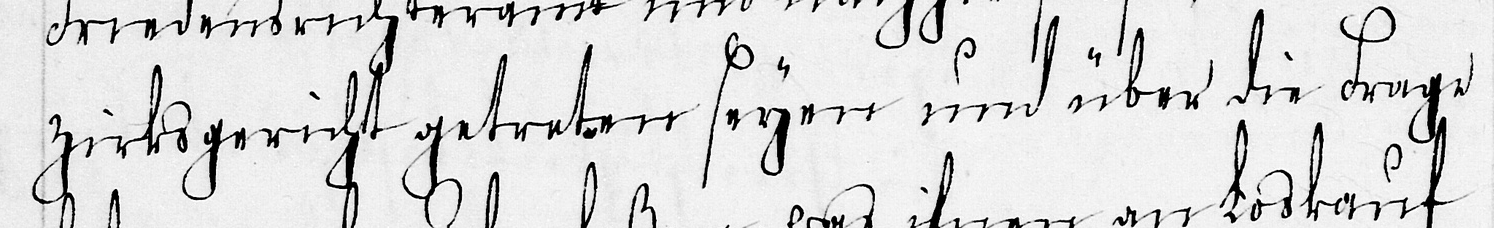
zirksgericht getreten seyen und über die Frage
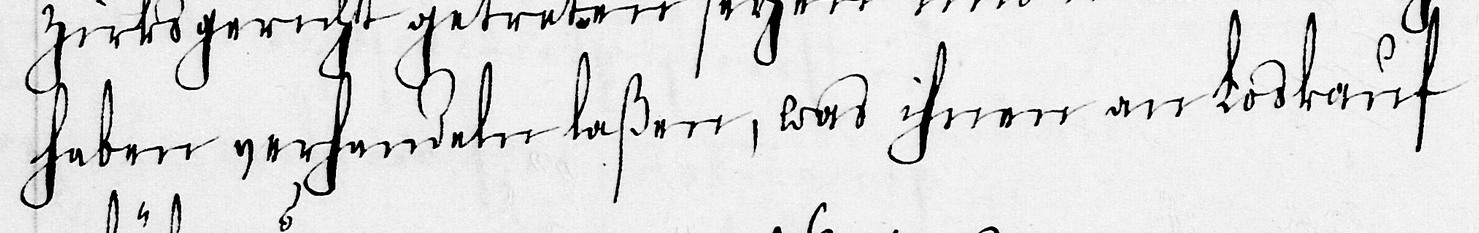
haben verhandeln laßen, was ihnen an Loskauf
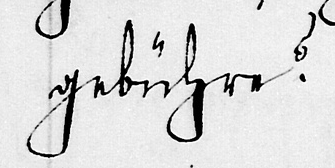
gebühre?
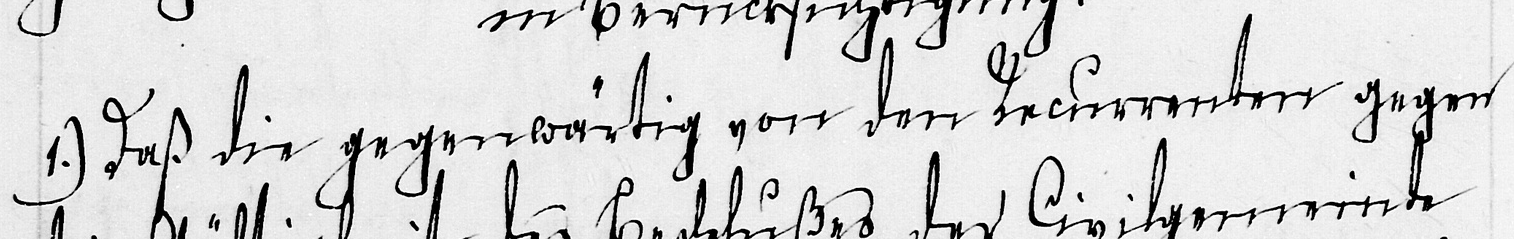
1.) Daß die gegenwärtig von den Recurrenten gegen
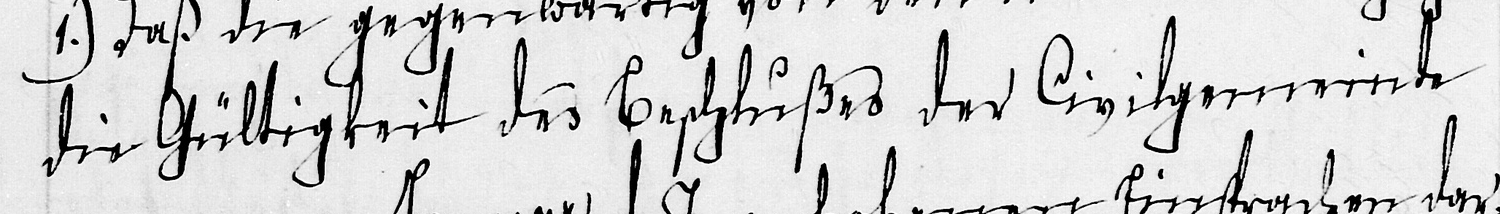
die Gültigkeit des Beschlußes der Civilgemeinde
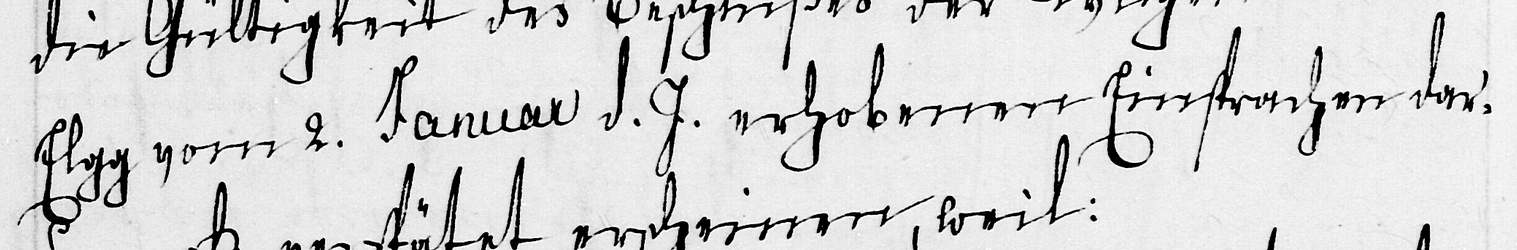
Elgg vom 2. Januar d. J. erhobenen Einsprachen dar¬
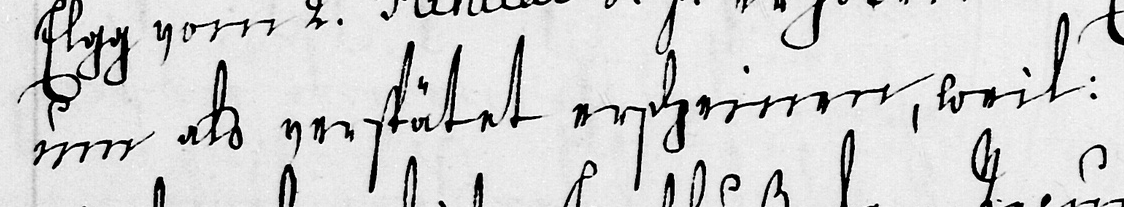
um als verspätet erscheinen, weil:
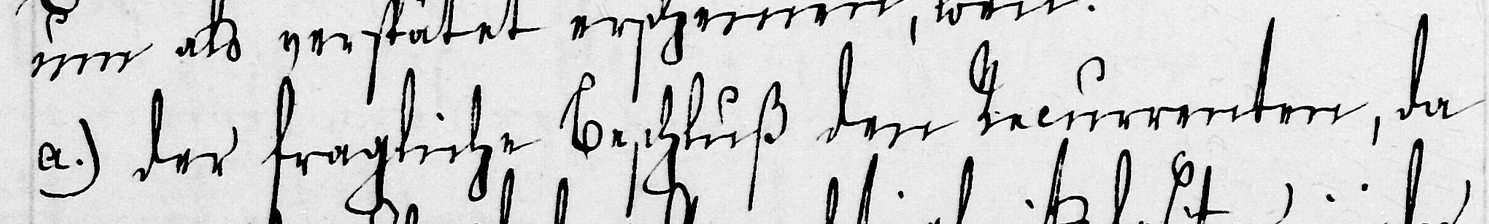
a.) Der fragliche Beschluß den Recurrenten, da
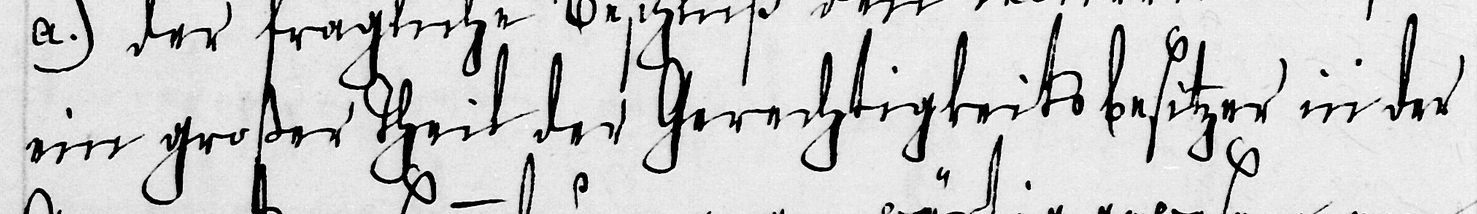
ein großer Theil der Gerechtigkeitsbesitzer in der
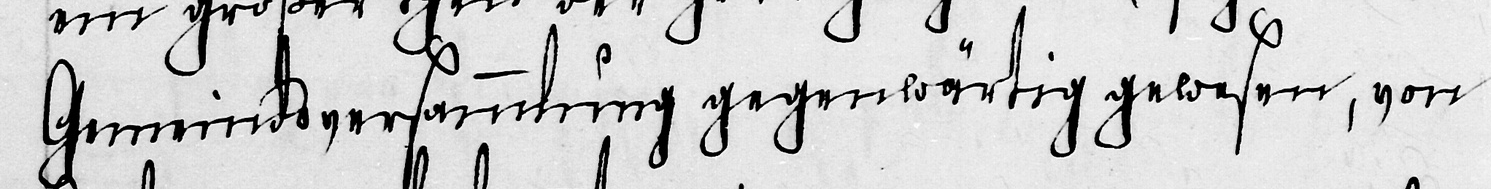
Gemeindsversammlung gegenwärtig gewesen, von
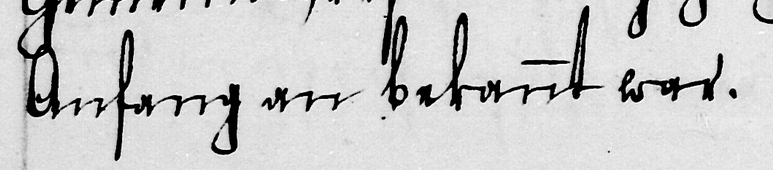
Anfang an bekannt war.
